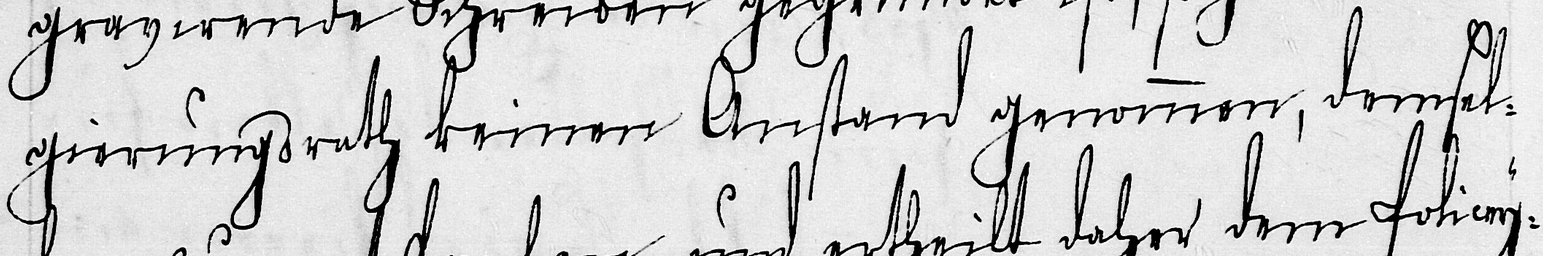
gierungsrath keinen Anstand genommen, demsel¬
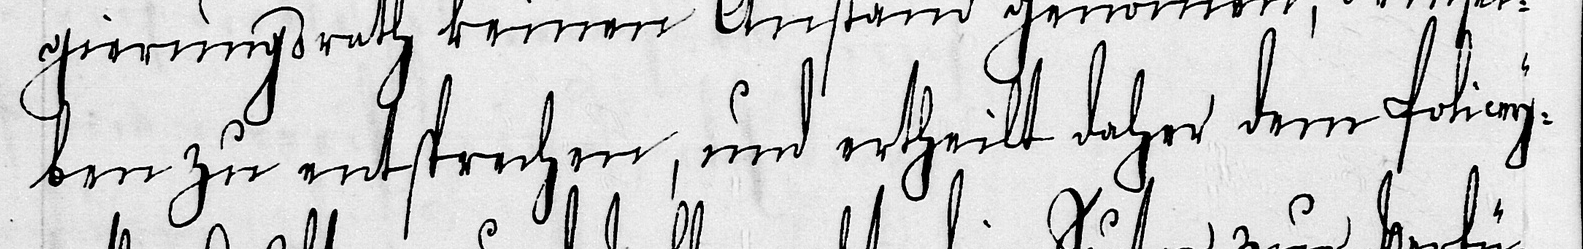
ben zu entsprechen, und ertheilt daher dem Police¬
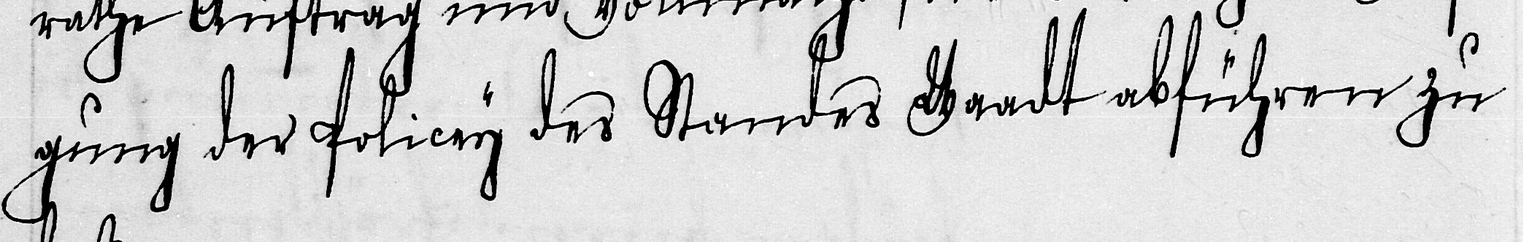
gung der Policey des Standes Waadt abführen zu
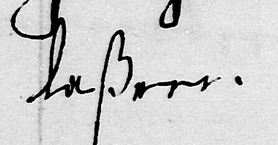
laßen.
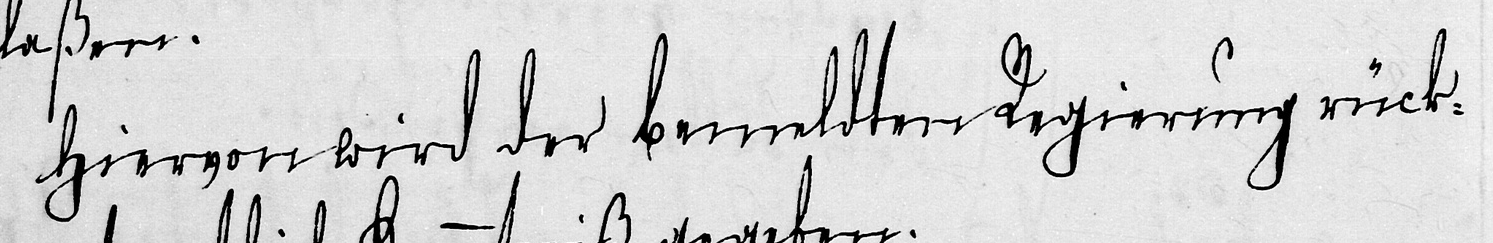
Hiervon wird der bemeldten Regierung rück¬
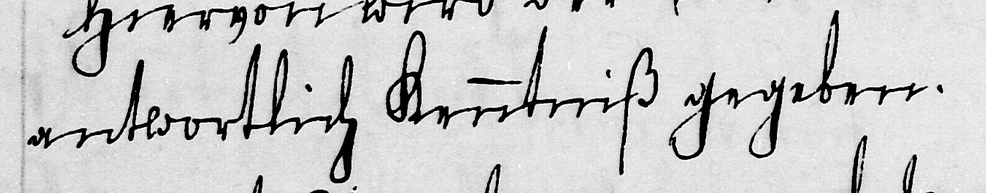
antwortlich Kenntniß gegeben.
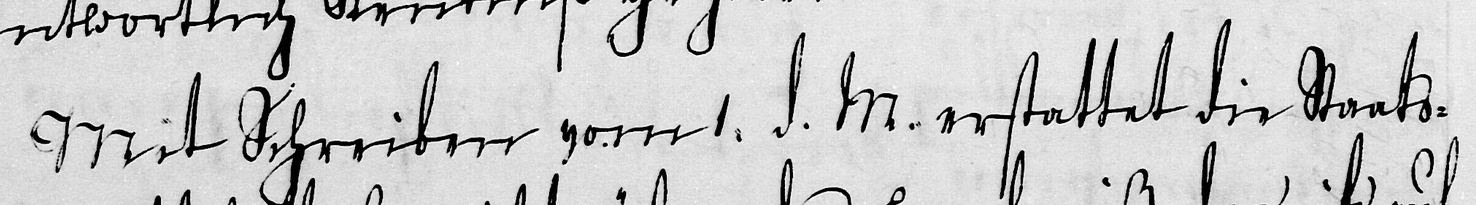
Mit Schreiben vom 1. d. M. erstattet die Staats¬
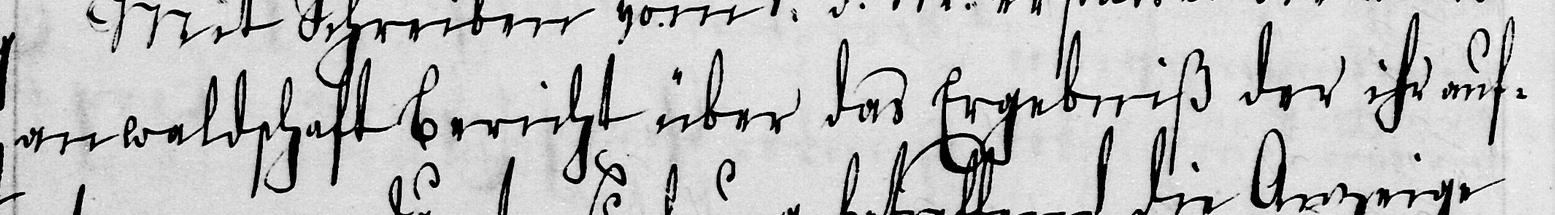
anwaldschaft Bericht über das Ergebniß der ihr auf¬
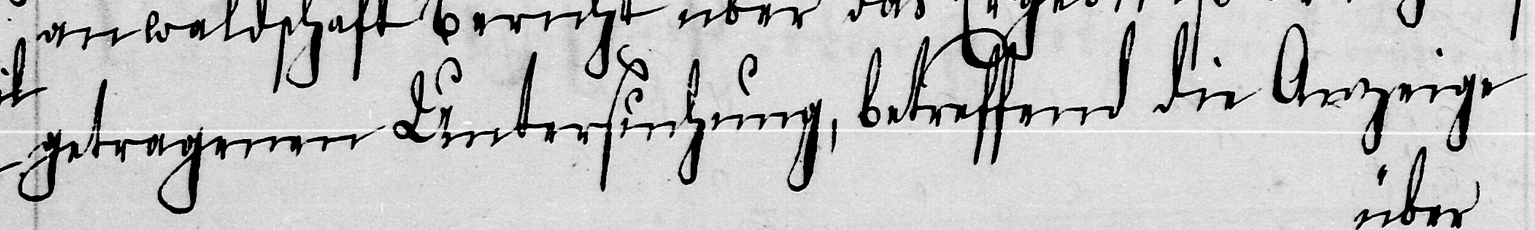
getragenen Untersuchung, betreffend die Anzeige
